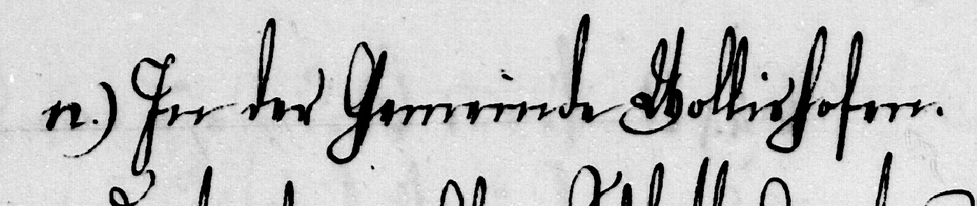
n.) In der Gemeinde Wollishofen.
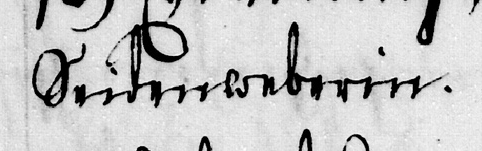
Seidenweberin.
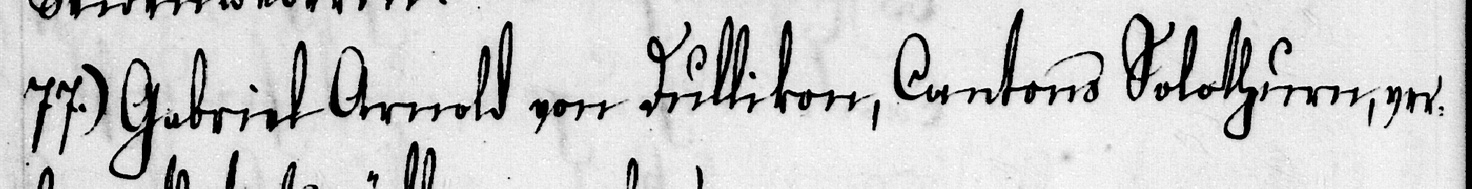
77.) Gabriel Arnold von Dullikon, Cantons Solothurn, ve¬
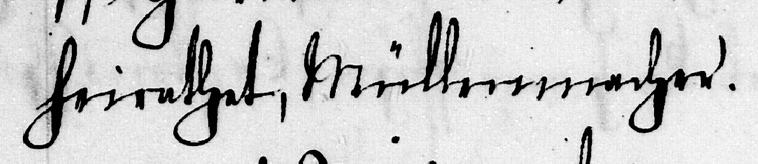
rheirathet, Müllenmacher.
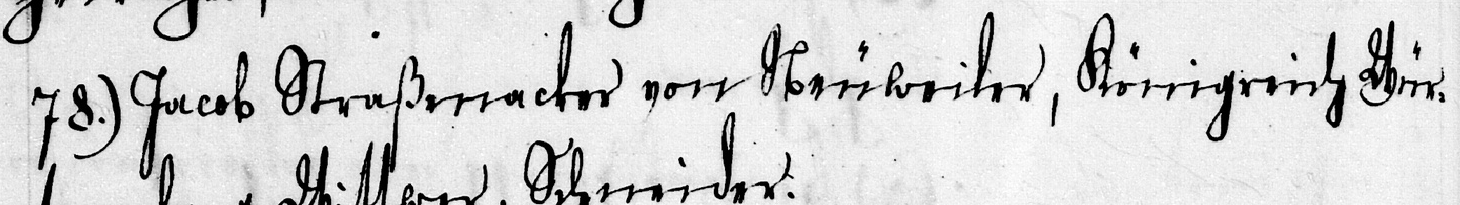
78.) Jacob Straßenacker von Neuweiler, Königreich Wür¬
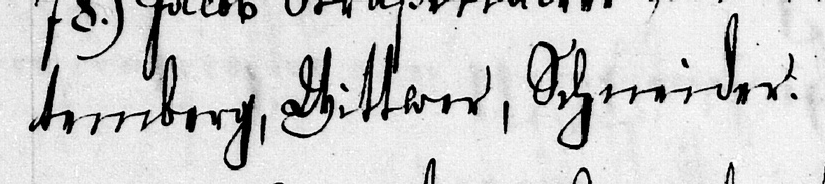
temberg, Wittwer, Schneider.
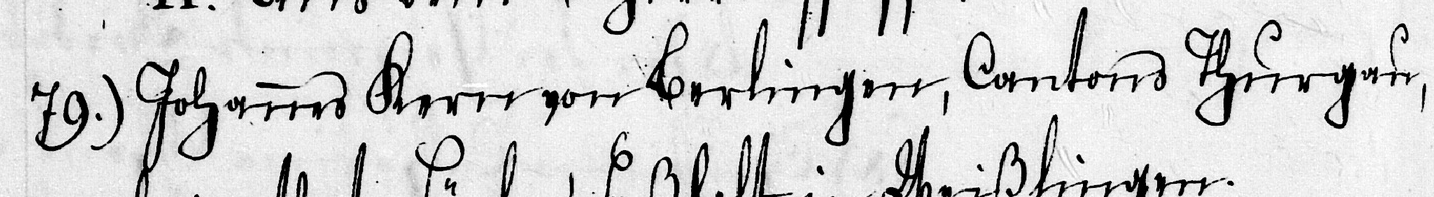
79.) Johannes Kern von Berlingen, Cantons Thurgau,
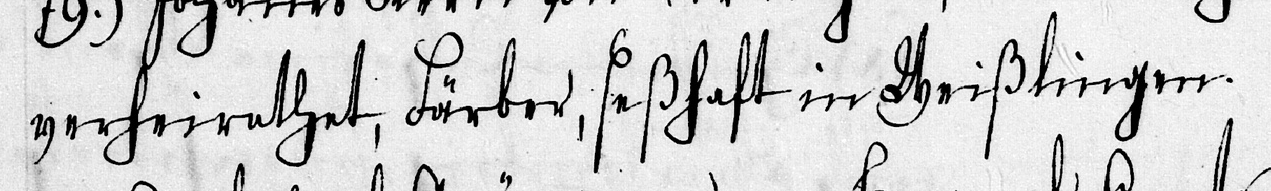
verheirathet, Färber, seßhaft in Weißlingen.
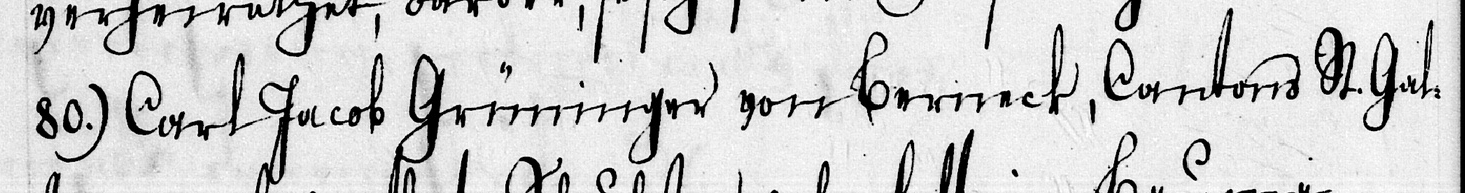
80.) Carl Jacob Grüninger von Berneck, Cantons St. Gal¬
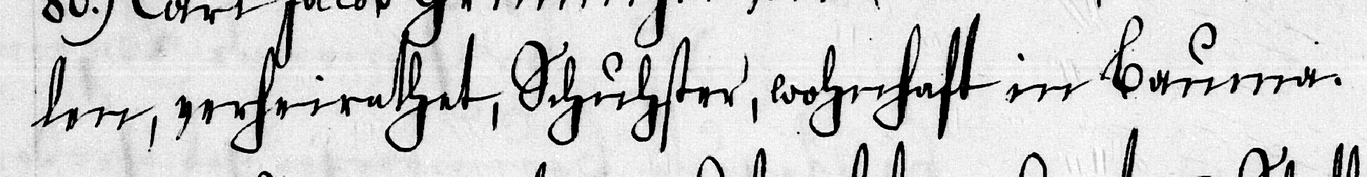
len, verheirathet, Schuhster, wohnhaft in Bauma.
